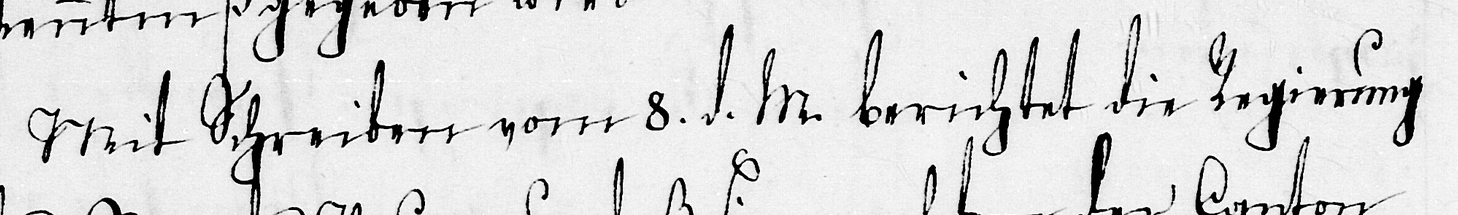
Mit Schreiben vom 8. d. M. berichtet die Regierung
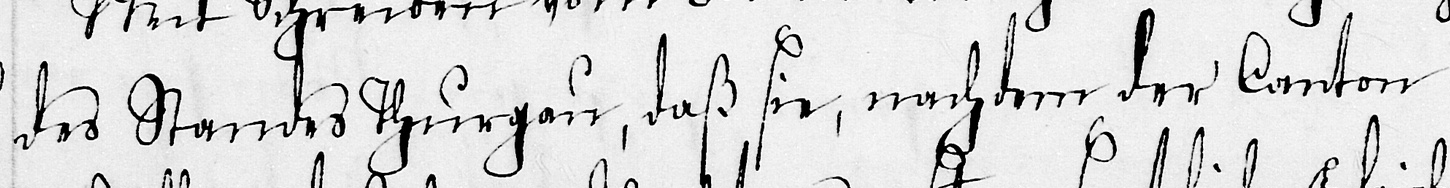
des Standes Thurgau, daß sie, nachdem der Canton
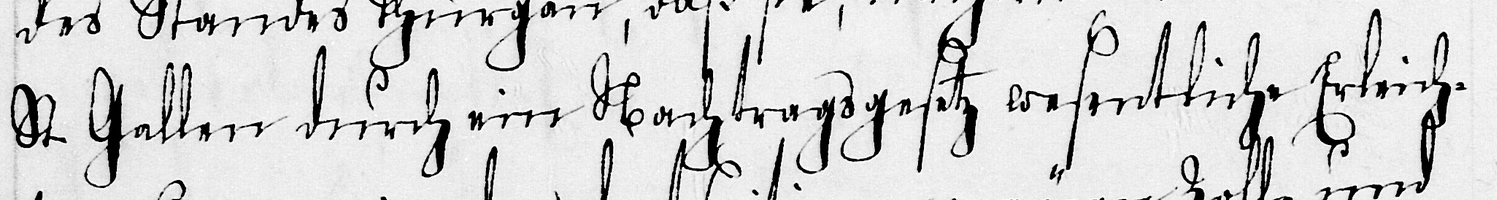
St. Gallen durch ein Nachtragsgesetz wesentliche Erleich¬
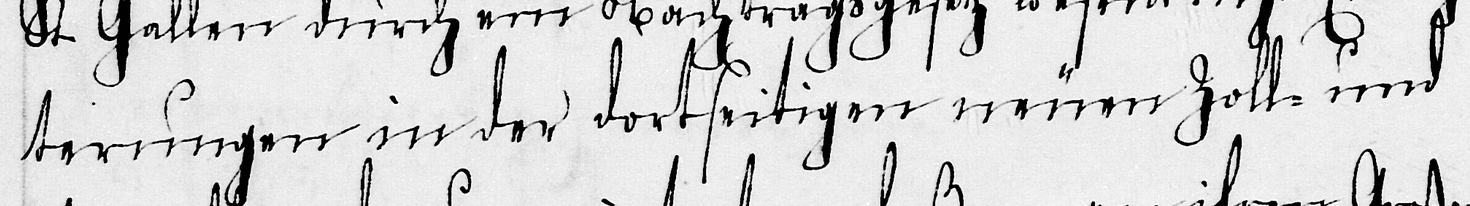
terungen in der dortseitigen neuen Zoll- und
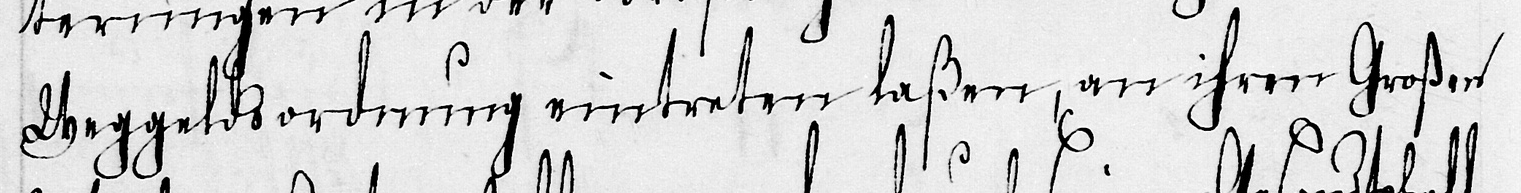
Weggeldsordnung eintreten laßen, an ihren Großen
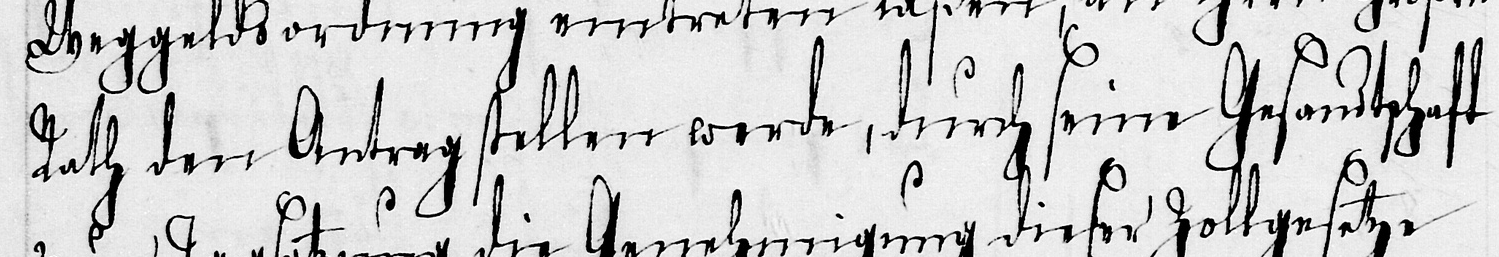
Rath den Antrag stellen werde, durch seine Gesandtscha¬
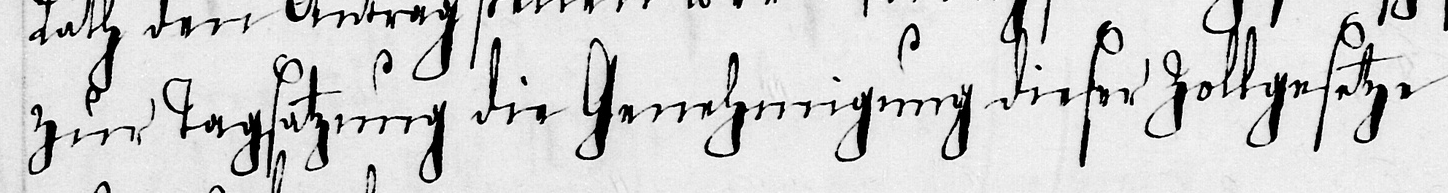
zur Tagsatzung die Genehmigung dieser Zollgesetze
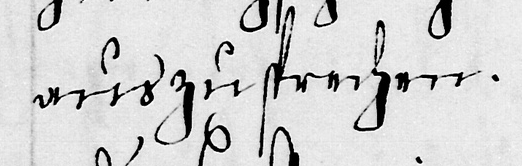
auszusprechen.
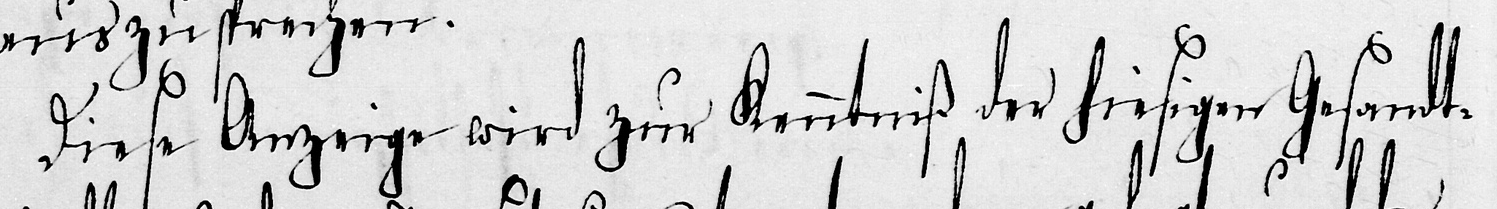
Diese Anzeige wird zur Kenntniß der hiesigen Gesandt¬
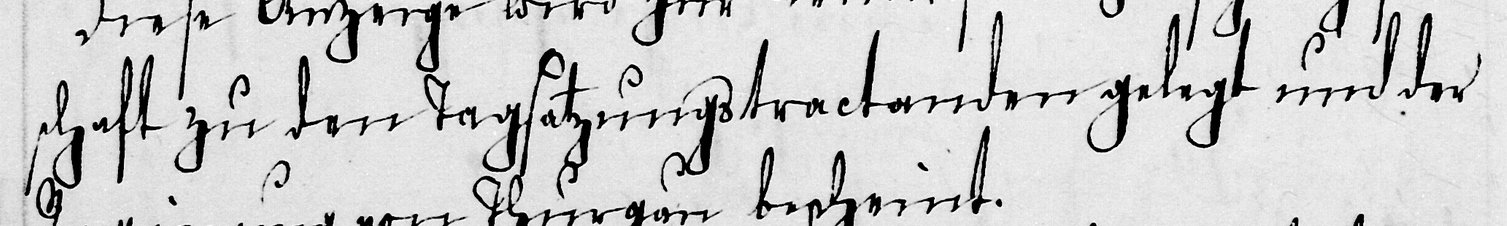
schaft zu den Tagsatzungstractanden gelegt und der
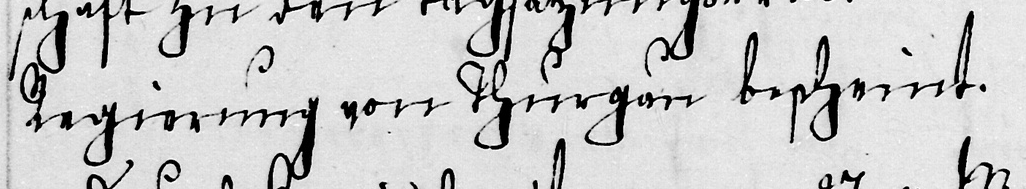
Regierung von Thurgau bescheint.
